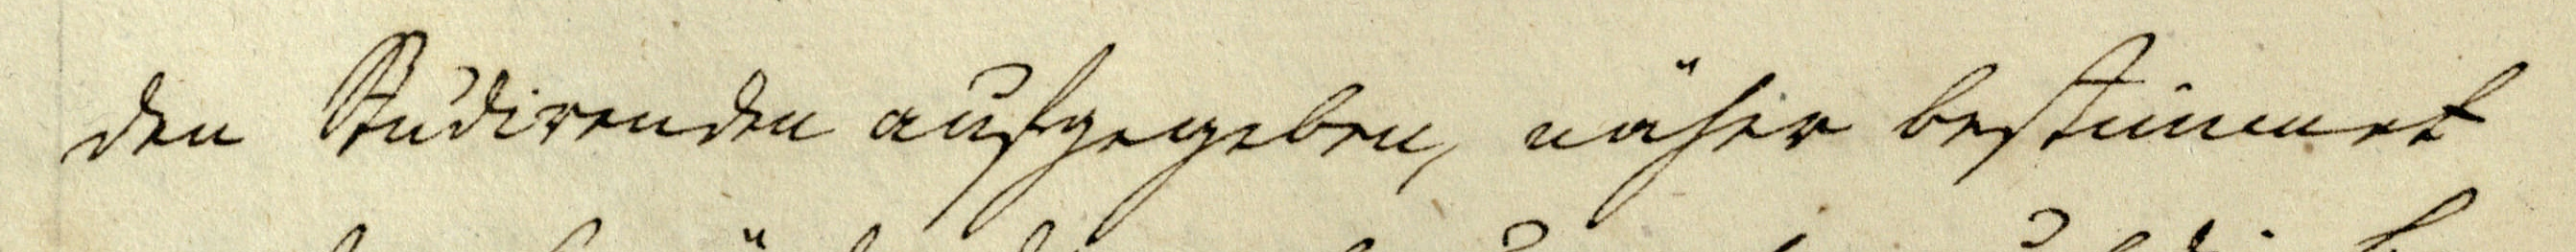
den Studirenden aufgegeben, näher bestimmet
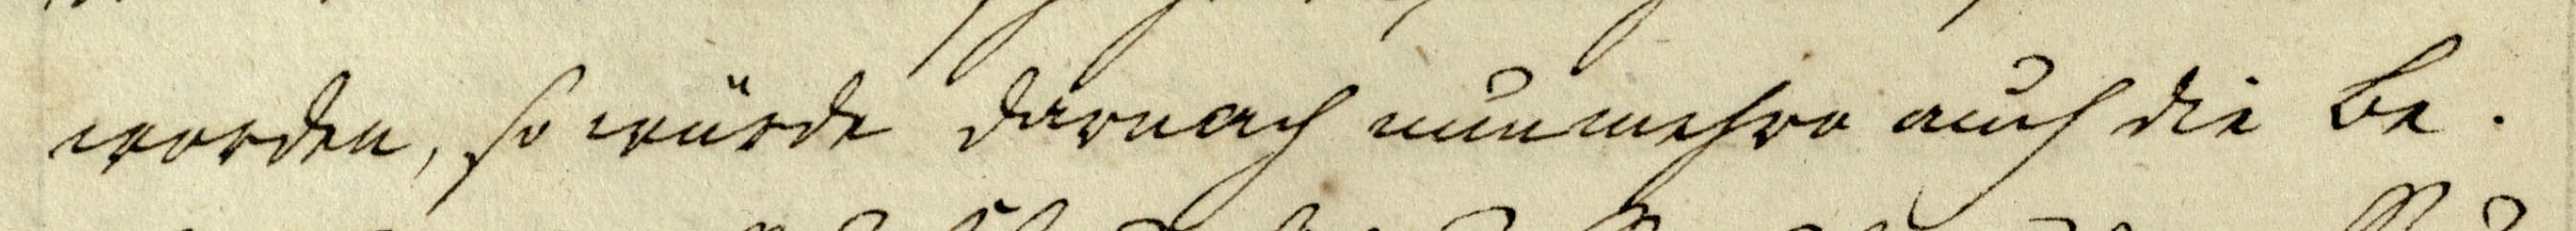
worden, so würde darnach nunmehro auch die Be¬
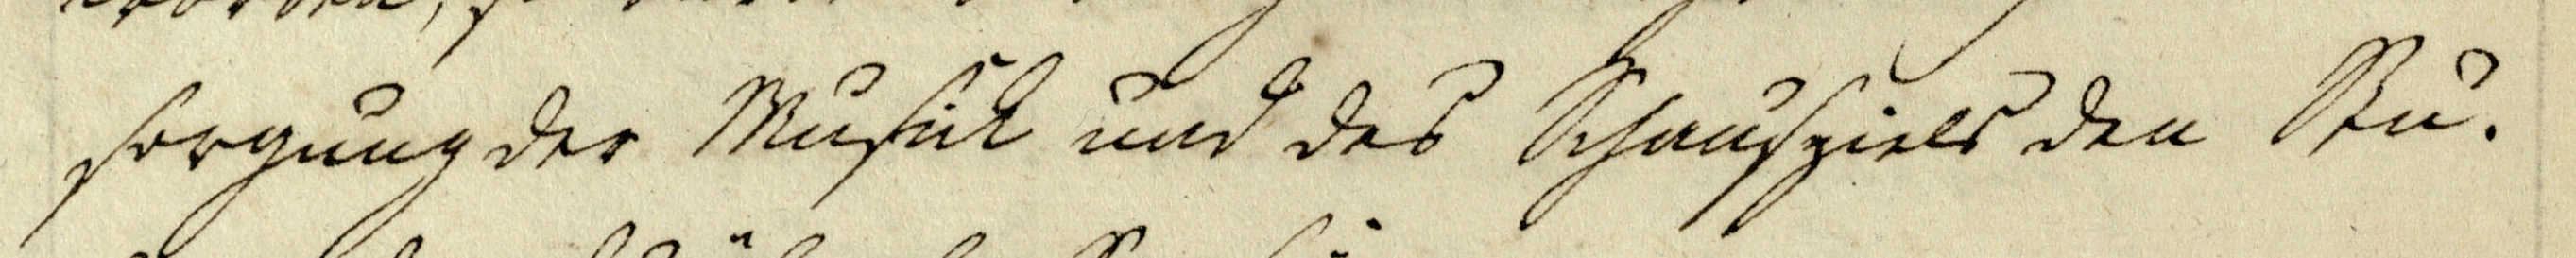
sorgung der Musick und des Schauspiels den Stu¬
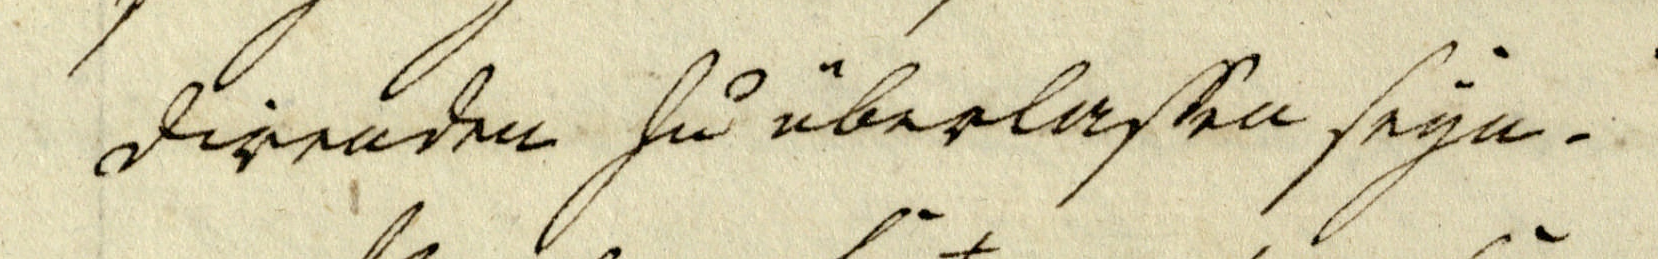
direnden zu überlassen seÿn.
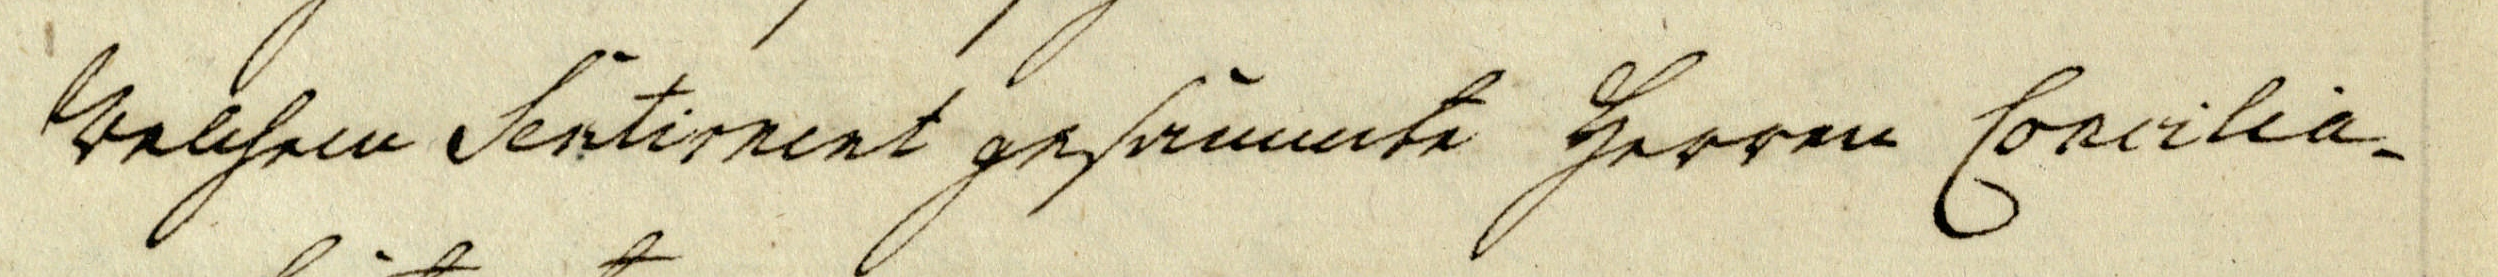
Welchem Sentiment gesammte Herren Concilia¬
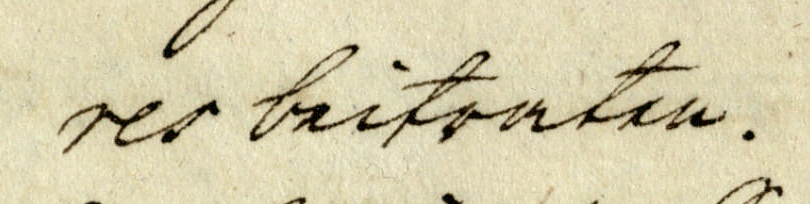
res beitraten.
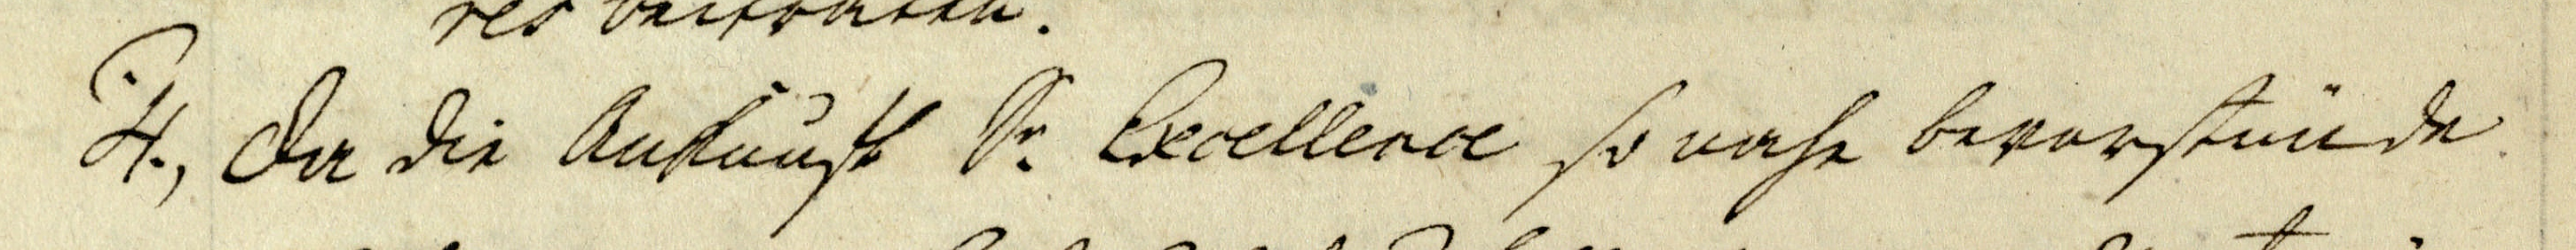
4. Da die Ankunft Sr. Excellence so nahe bevorstünde
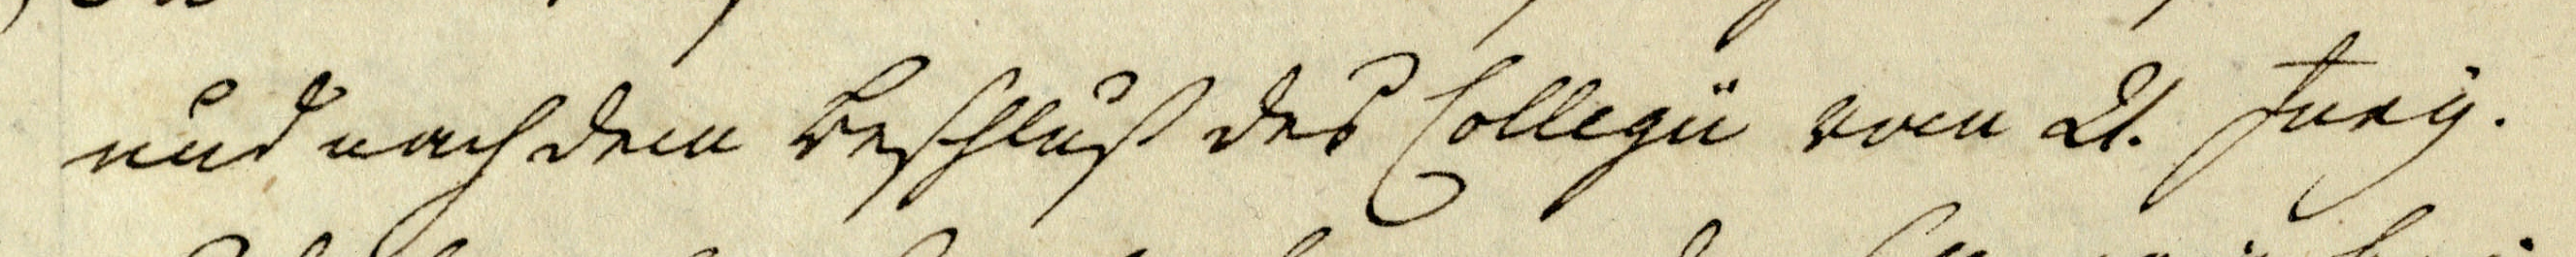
und nach dem Beschluß des Collegii vom 2. Junÿ.
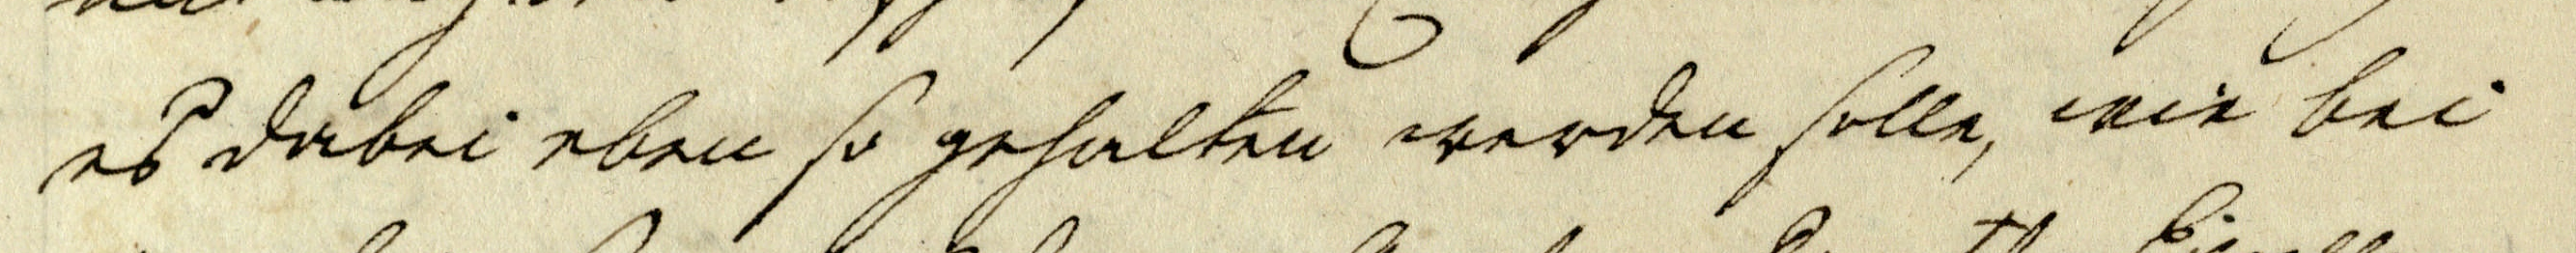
es dabei eben so gehalten werden solle, wie bei
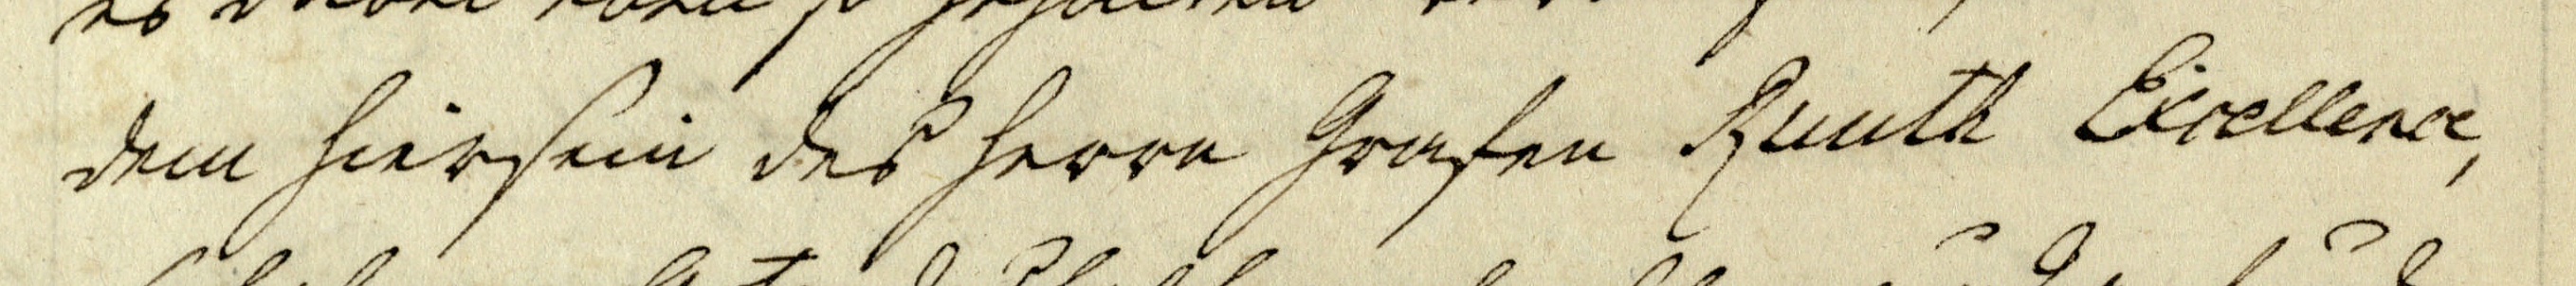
dem Hiersein des Herrn Grafen Ruuth Excellence,
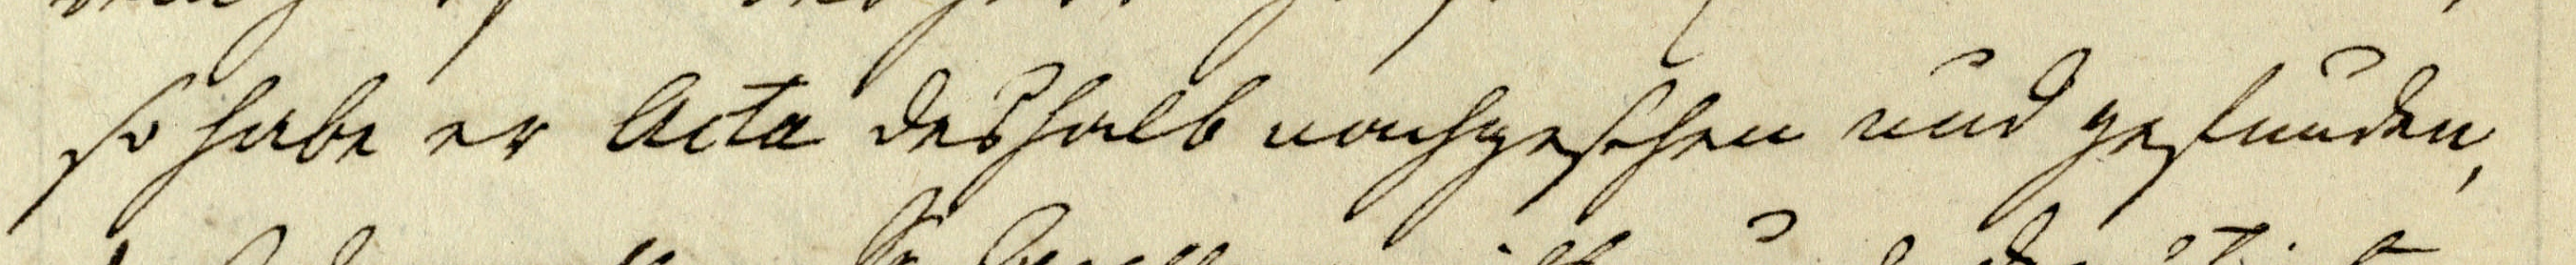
so habe er Acta deshalb nachgesehen und gefunden,
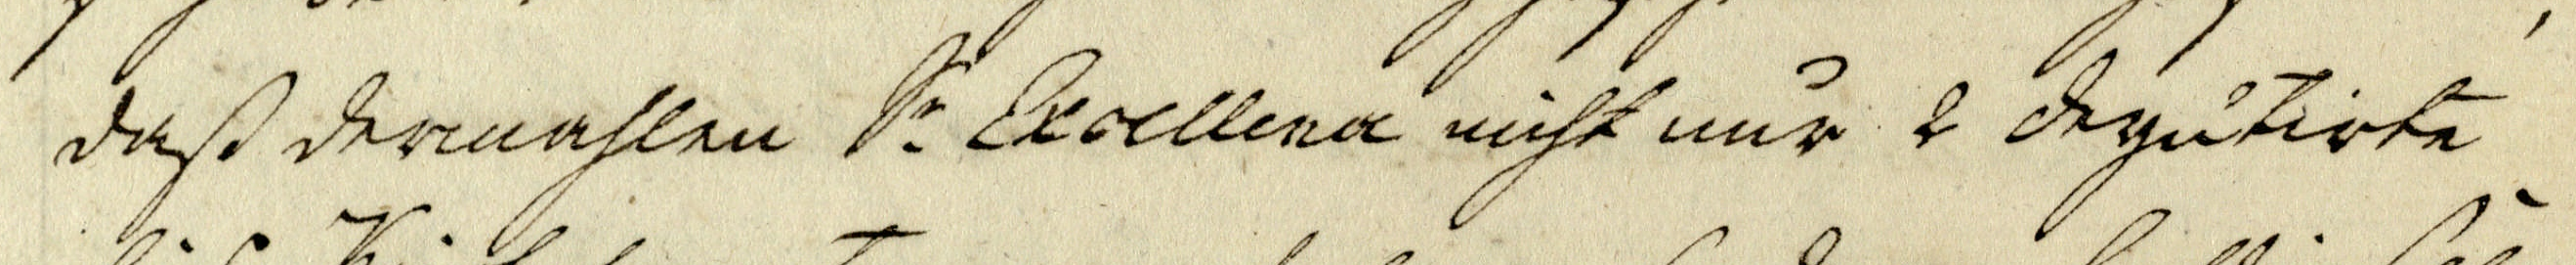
daß dermahlen Sr Excellence nicht nur 2 Deputirte
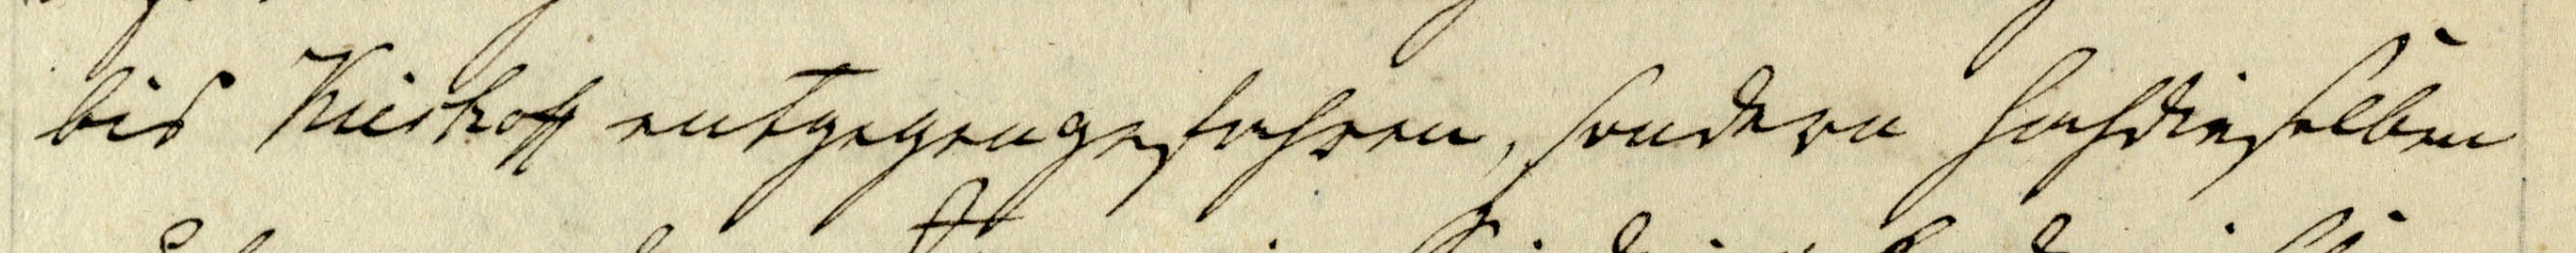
bis Kieshoff entgegengefahren, sondern hochdieselben
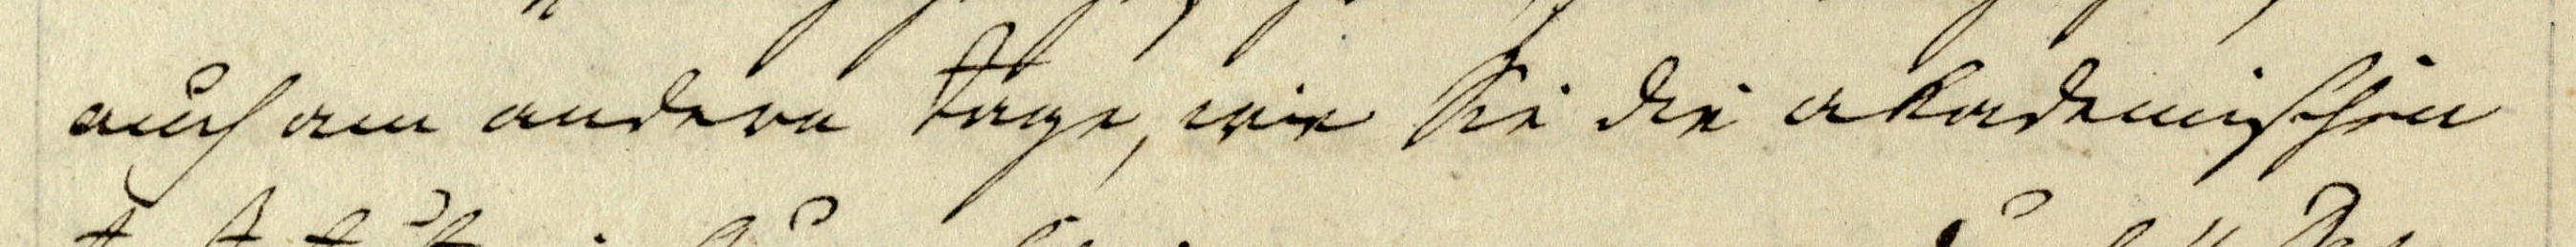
auch am andern Tage, wie Sie die akademischen
